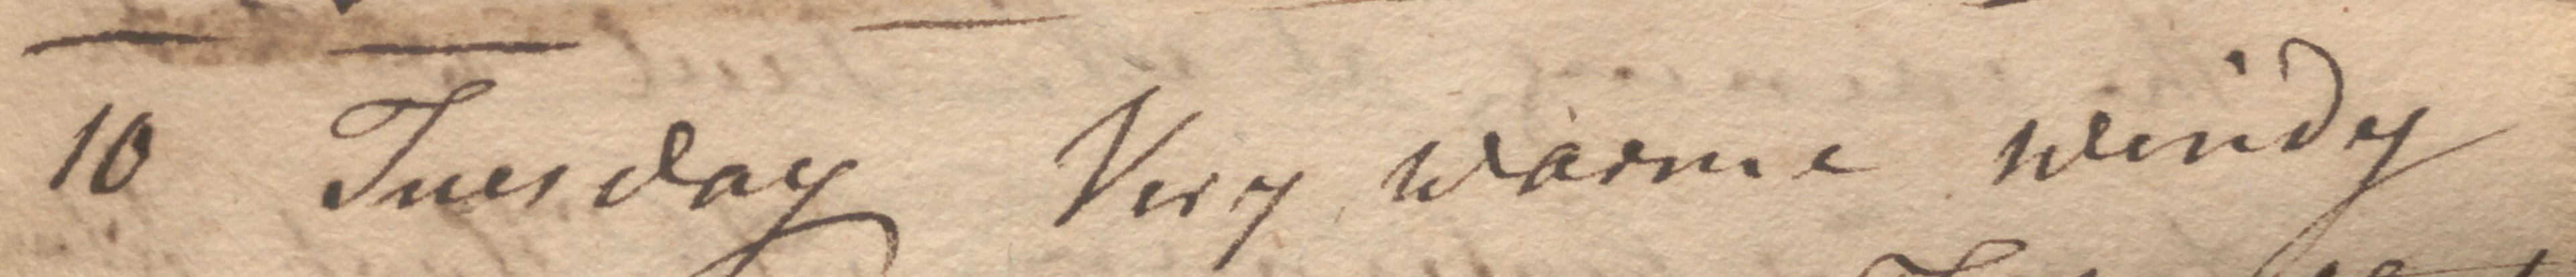10 Tuesday Very warme windy
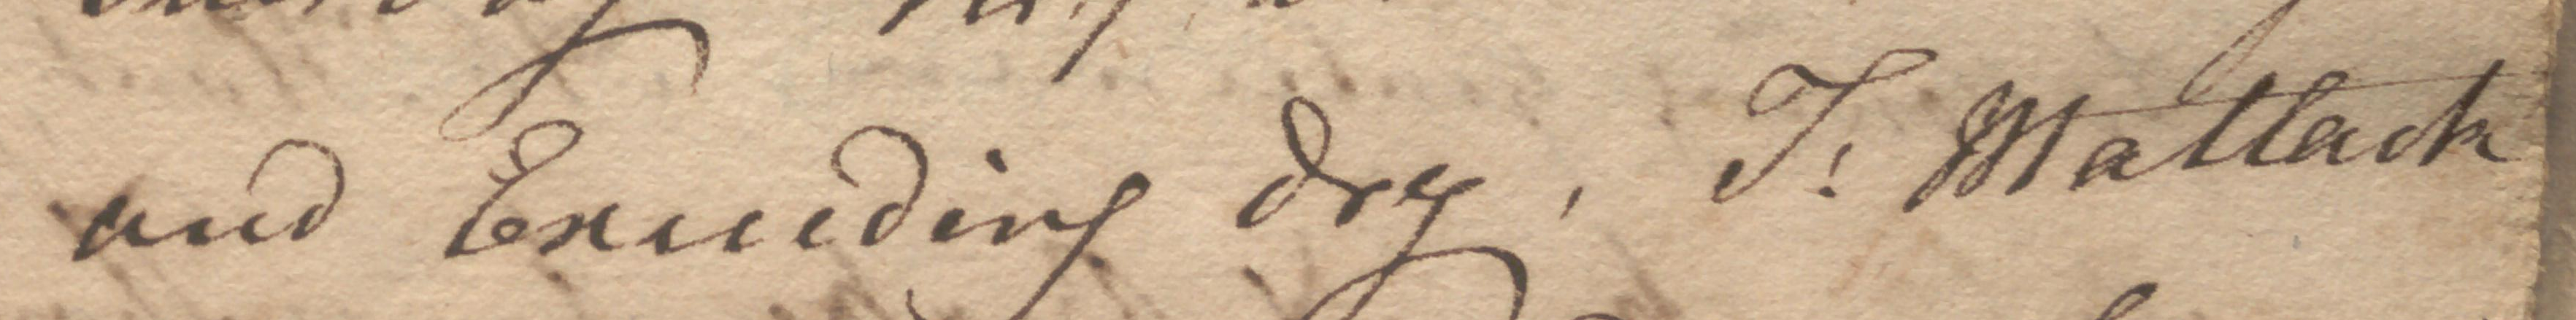and Exeeeding dry. T: Matlack
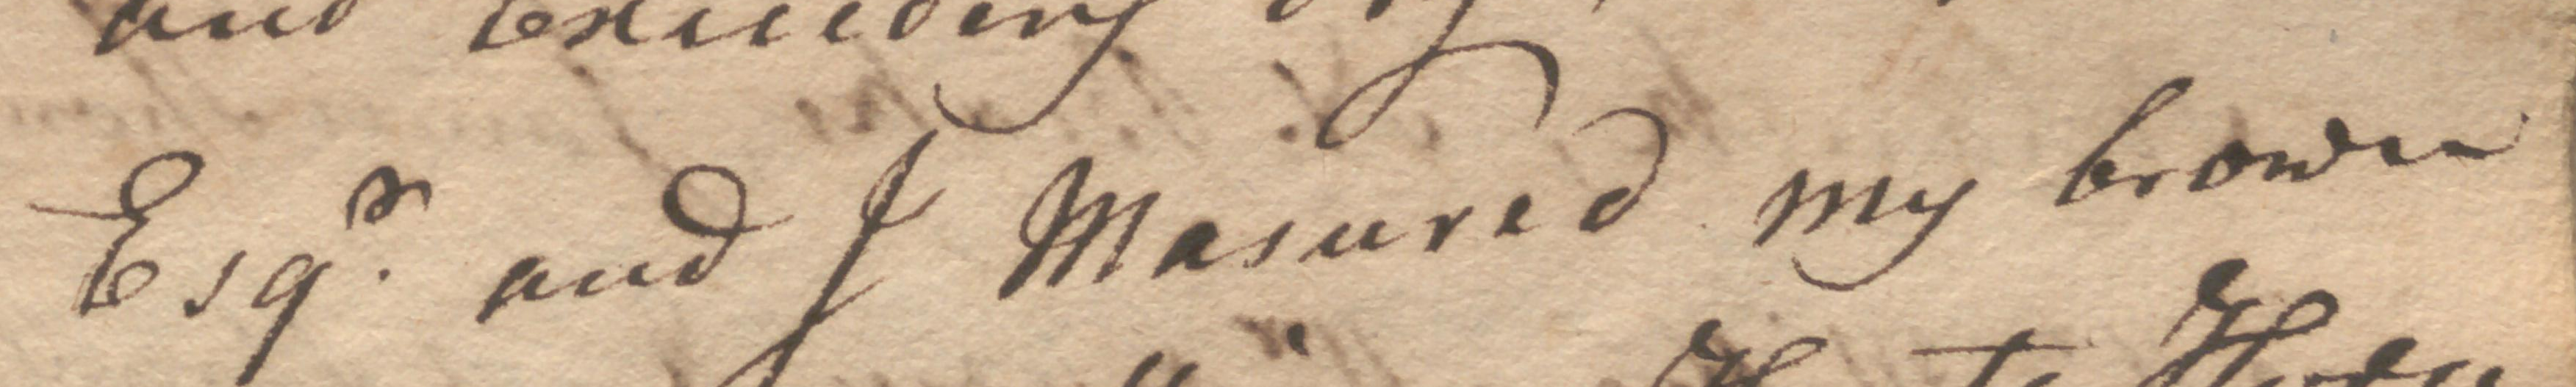Esq^r. and I Masured my brown
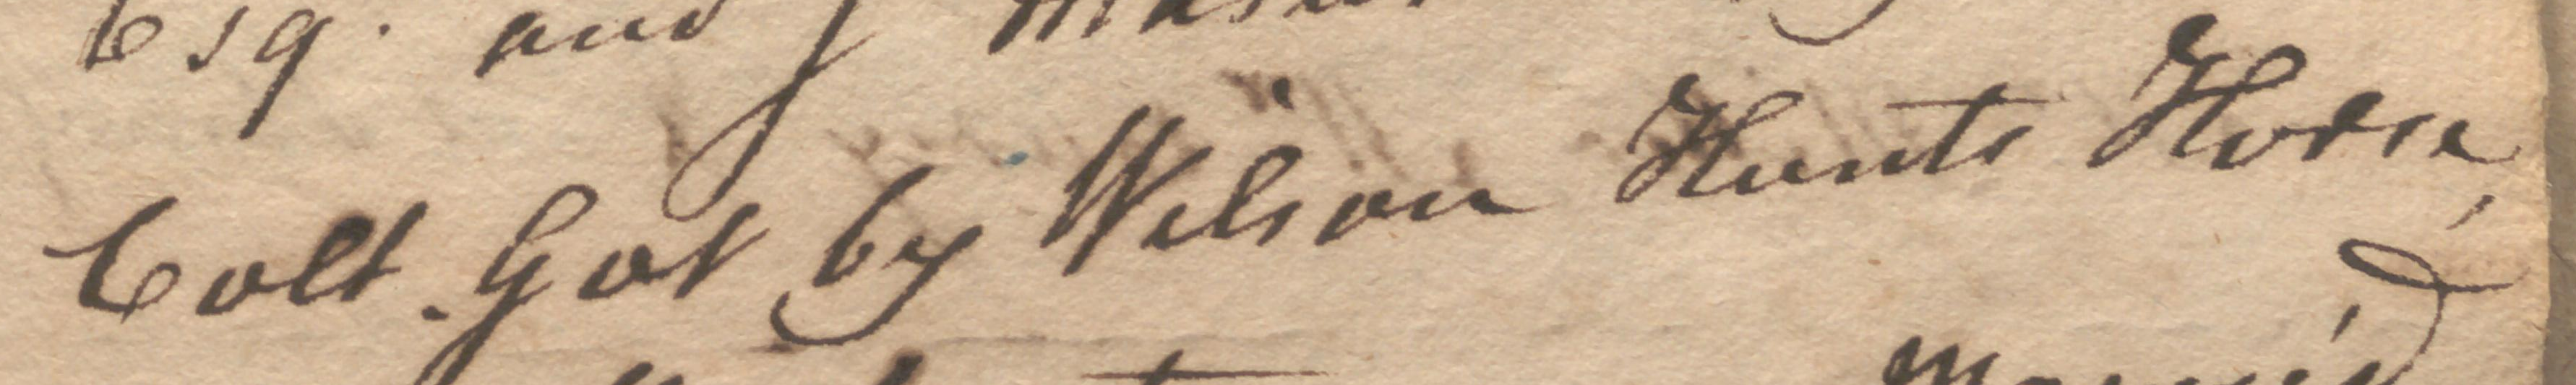Colt Got by Wilson Hunts Horse
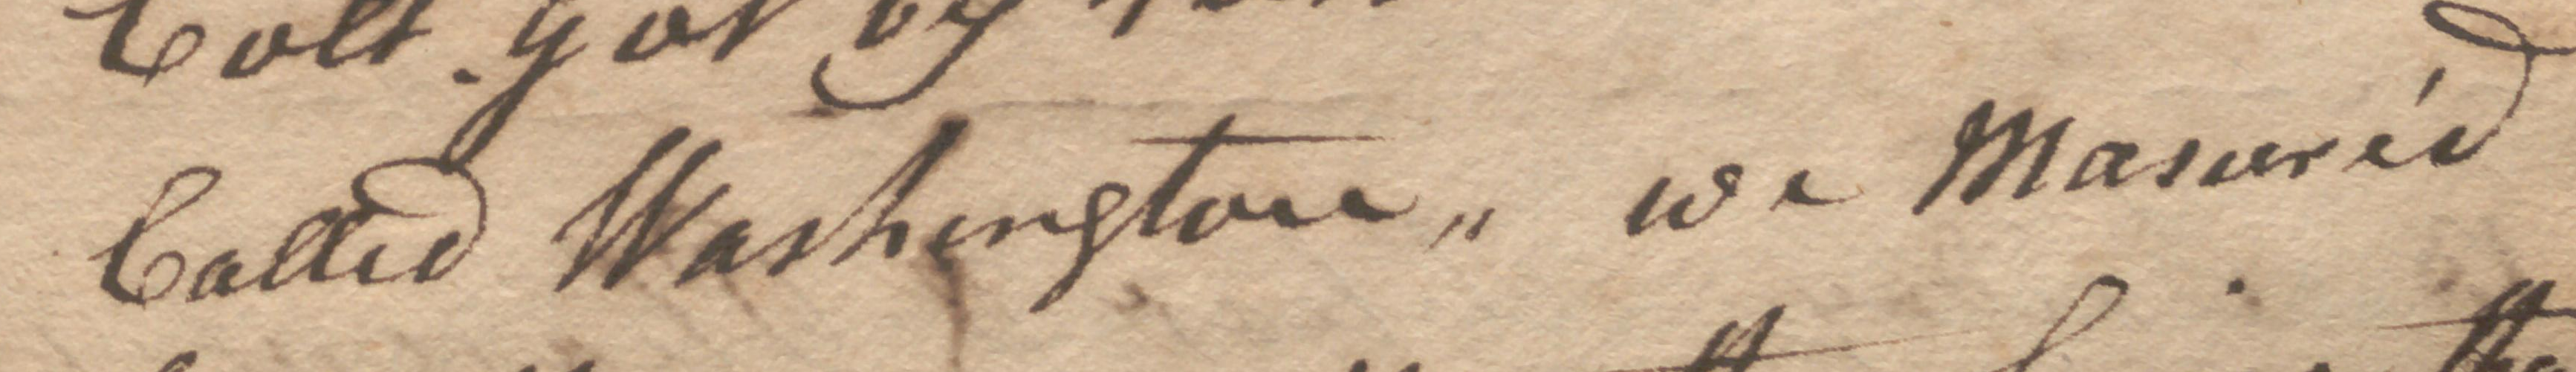Called Washington, we Masured
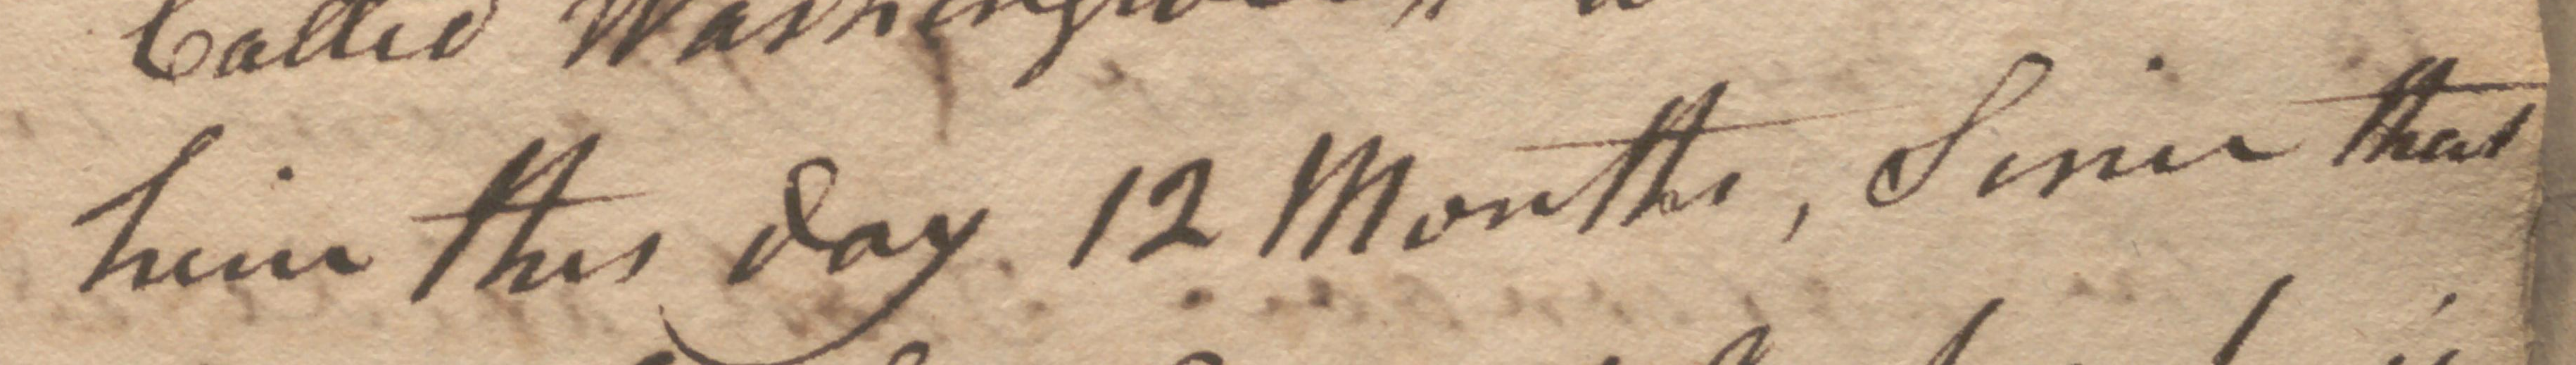him this day 12 Months, since that
